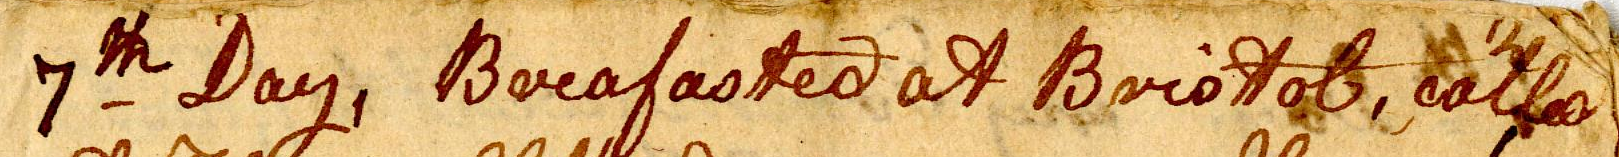7^th Day, Breakfasted at Bristol, called
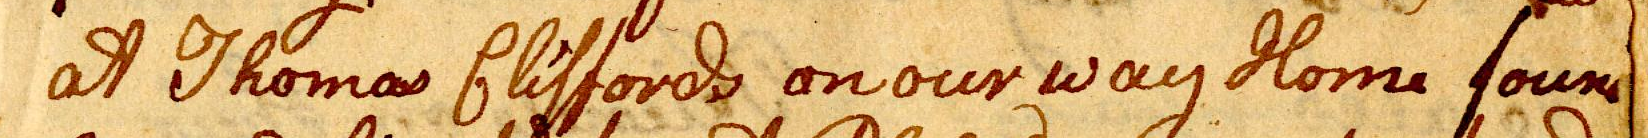at Thomas Cliffords on our way Home found
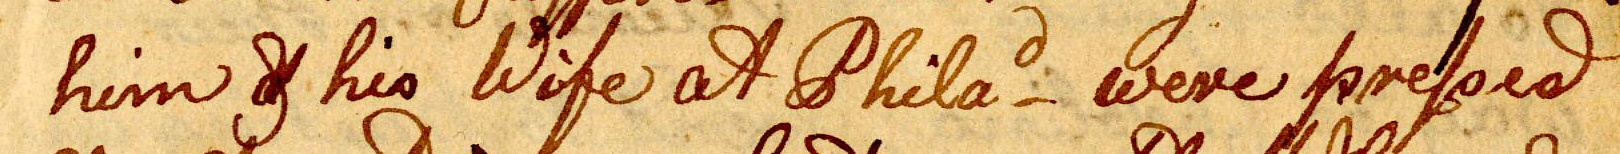him& his Wife at Phila^d were pressed
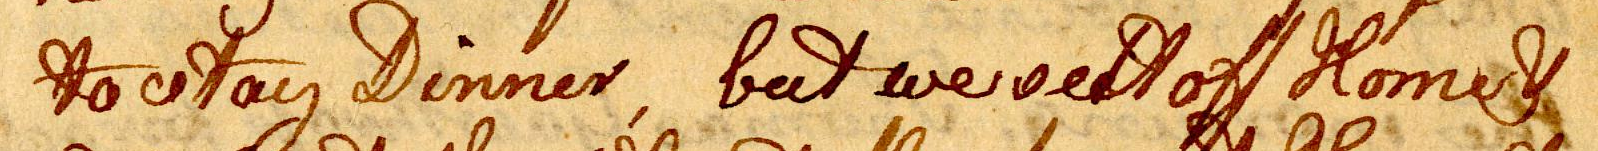to stay Dinner, but we sett off Home &
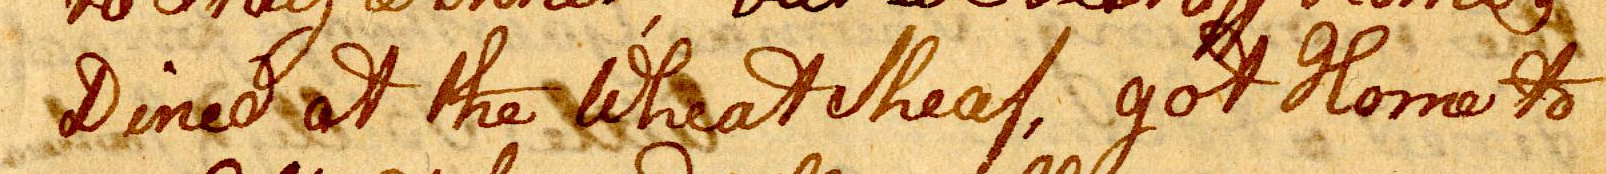Dined at the Wheat Sheaf, got Home to
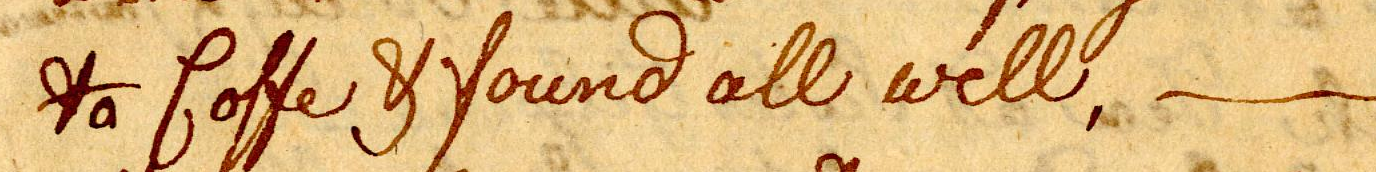to Coffe & found all well,-
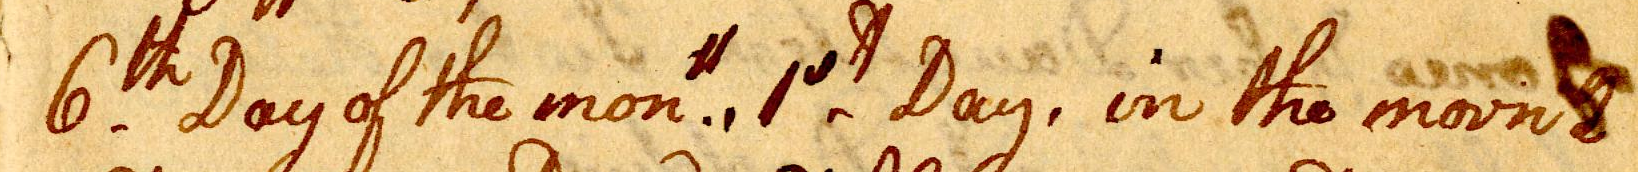6^th. Day of the mon^th., 1^st. Day, in the morn^g
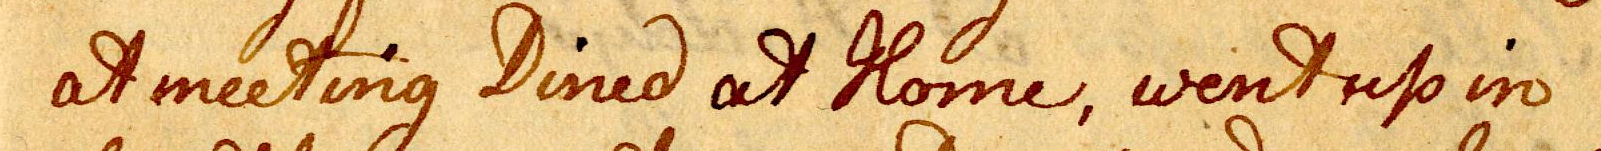at meeting Dined at Home, went up in
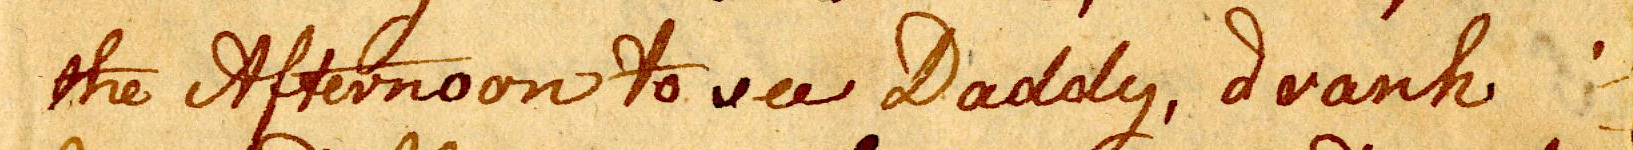the Afternoon to see Daddy, drank
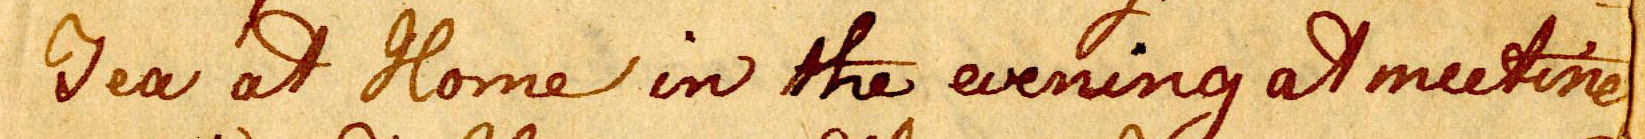Tea at Home in the evening at meeting
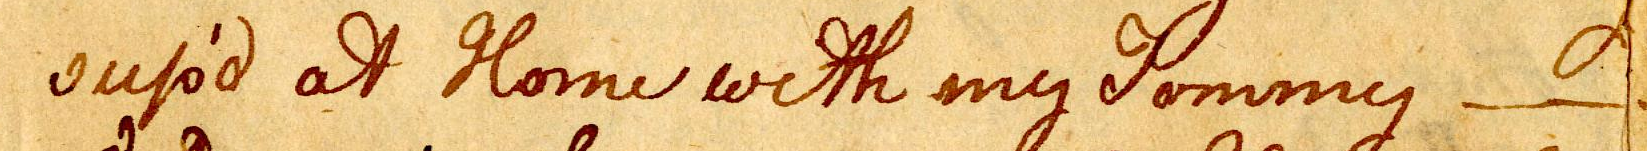sup'd at Home with my Tommy-
